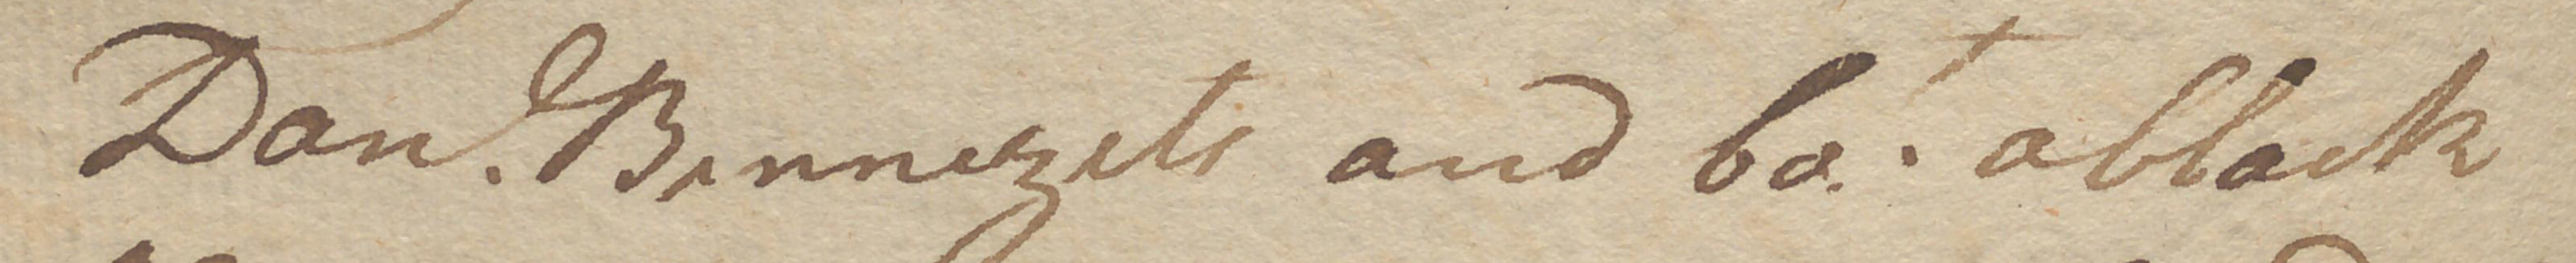Dan^l. Bennezets and bo^t. a black
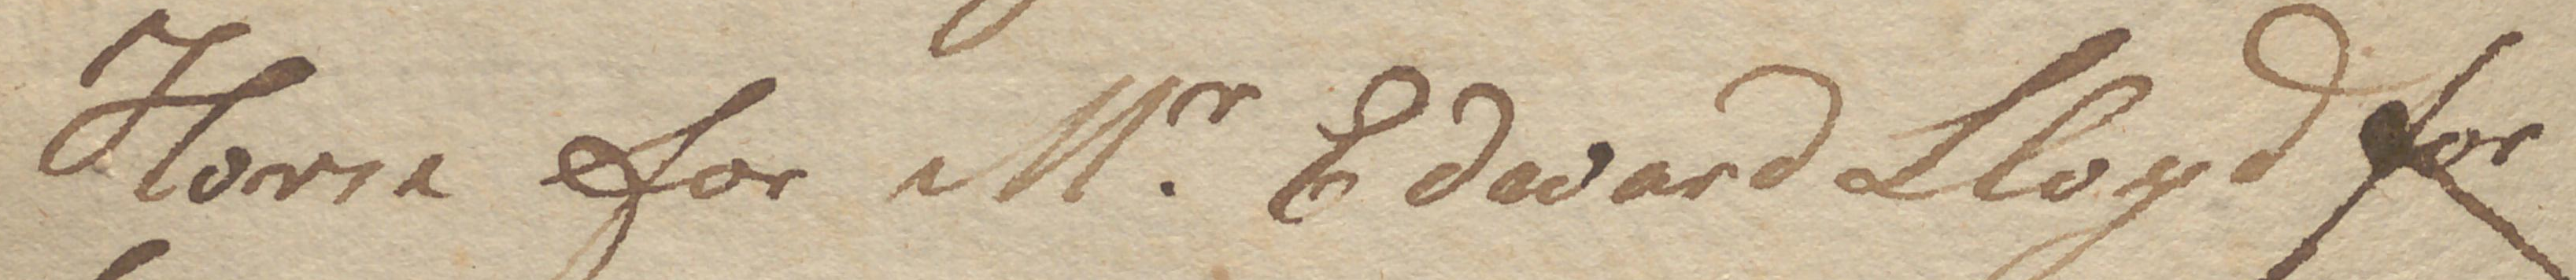Horse for M^r. Edward Lloyd for
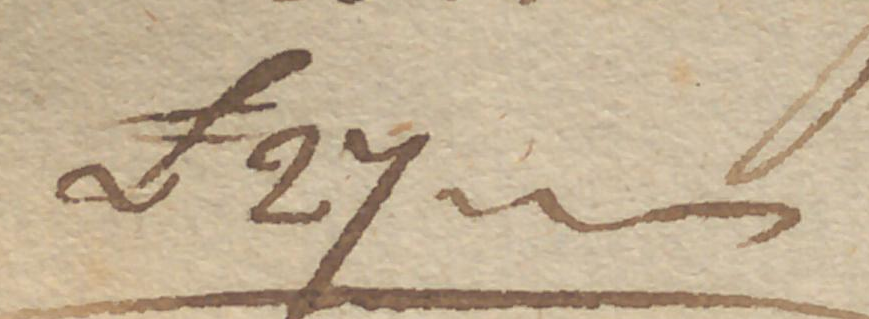£27-
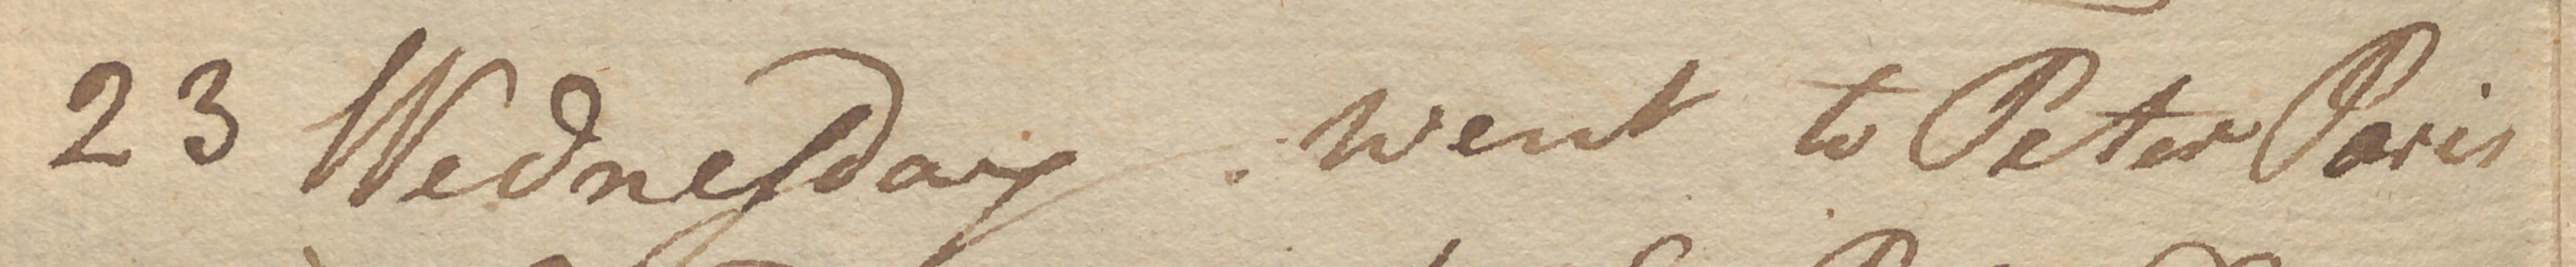23 Wednesday. went to Peter Paris
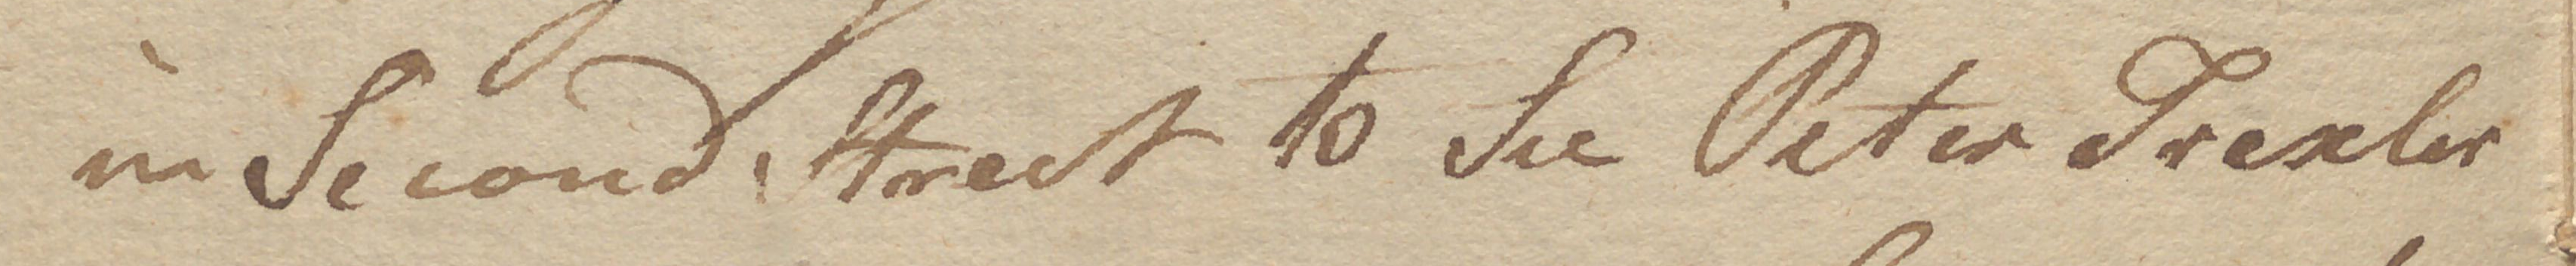in Second Street to see Peter Trexler
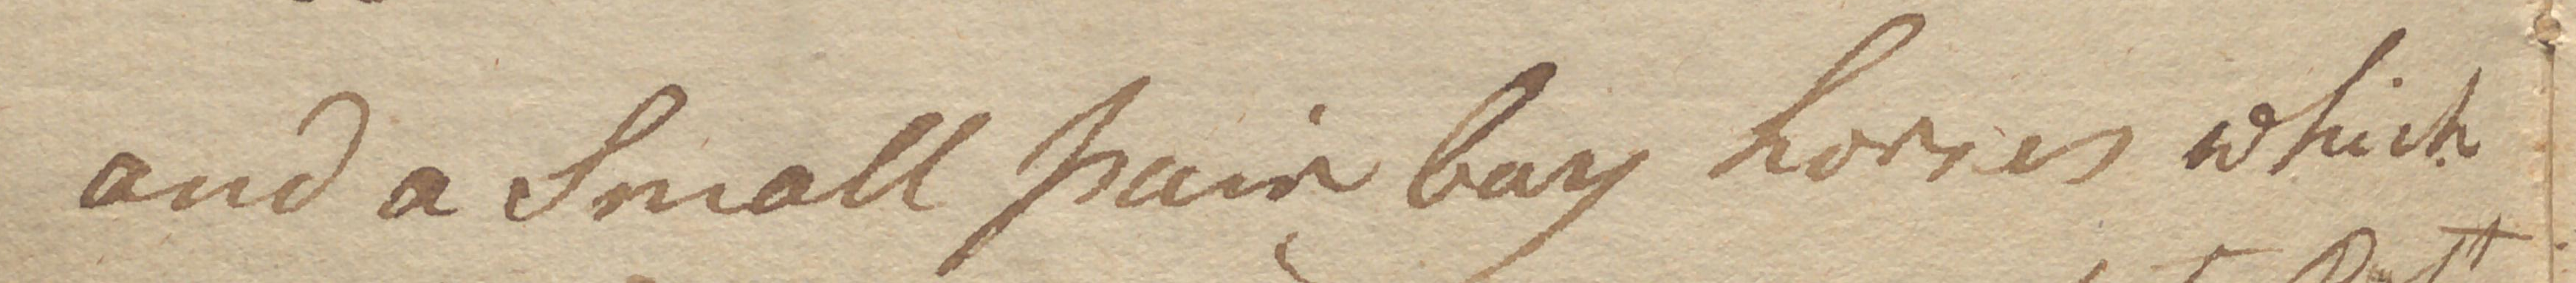and a small pair bay horses which
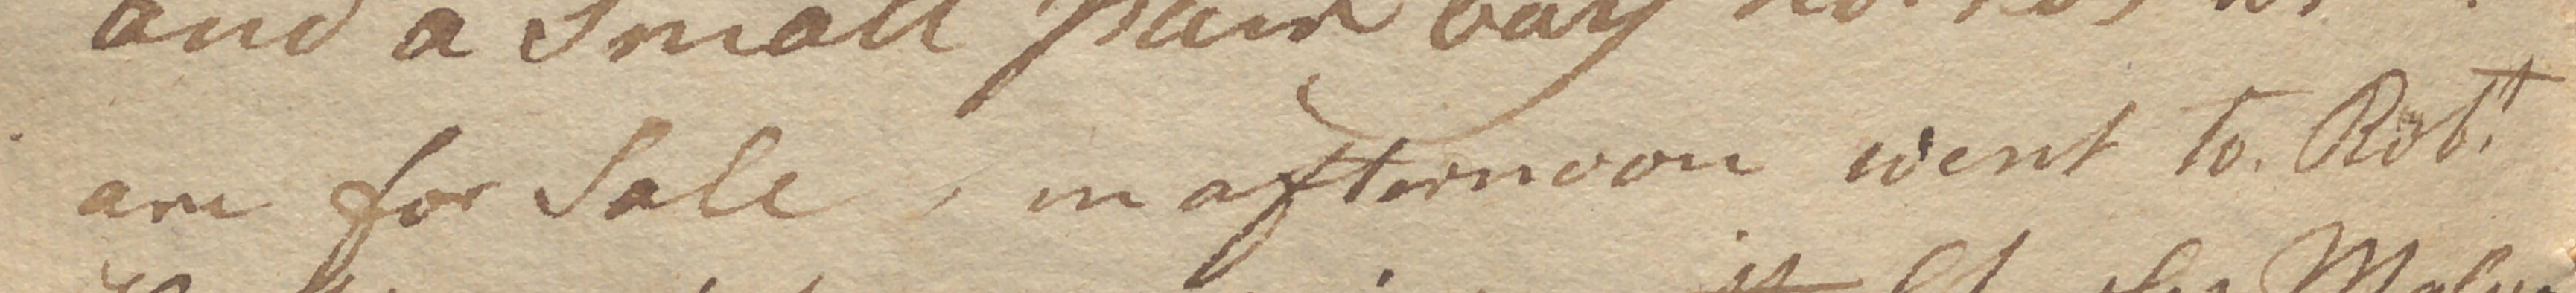are for Sale, in afternoon went to Rob^t.
